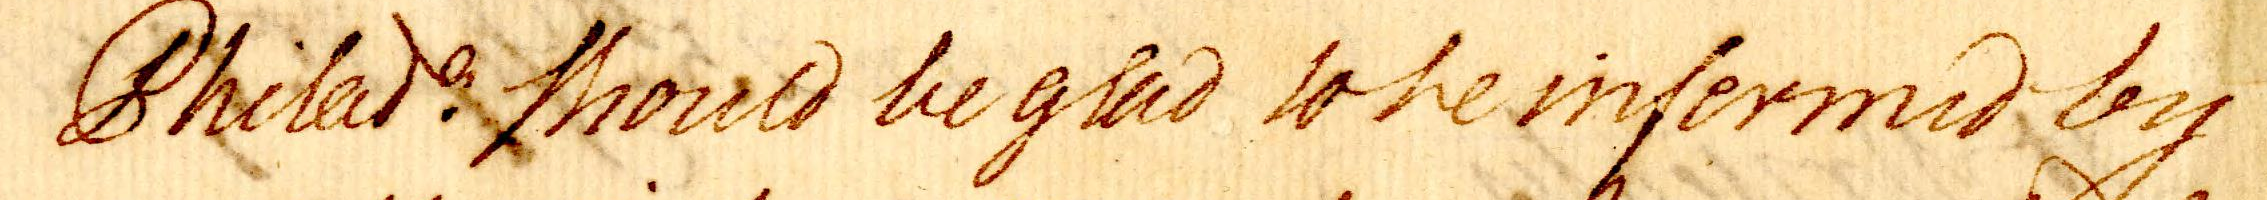Philad^a. should be glad to be informed by
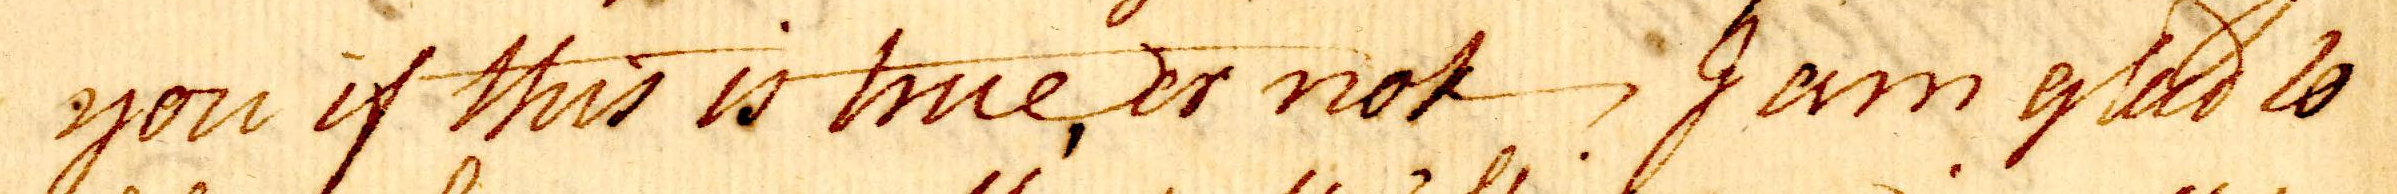you if this is true, or not. I am glad to
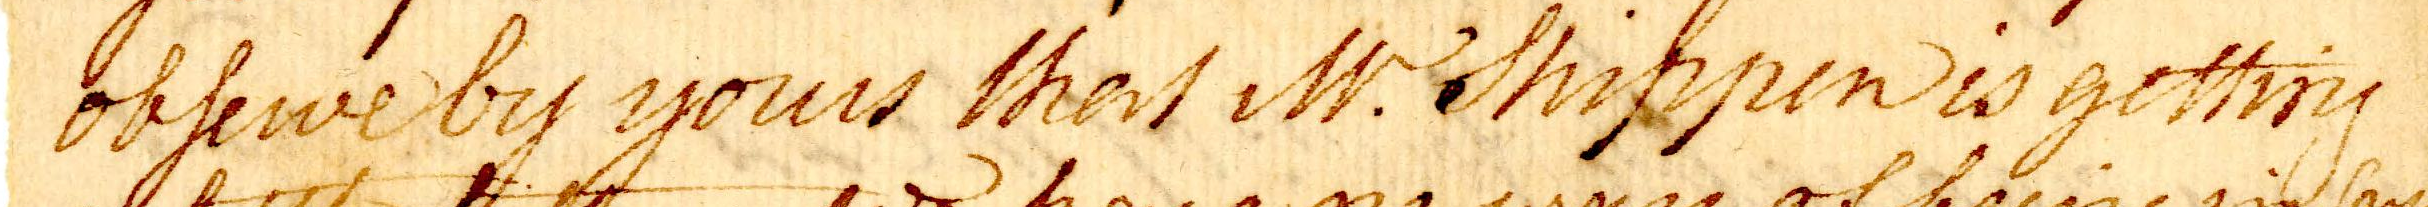observe by yours that M^r. Shippen is getting
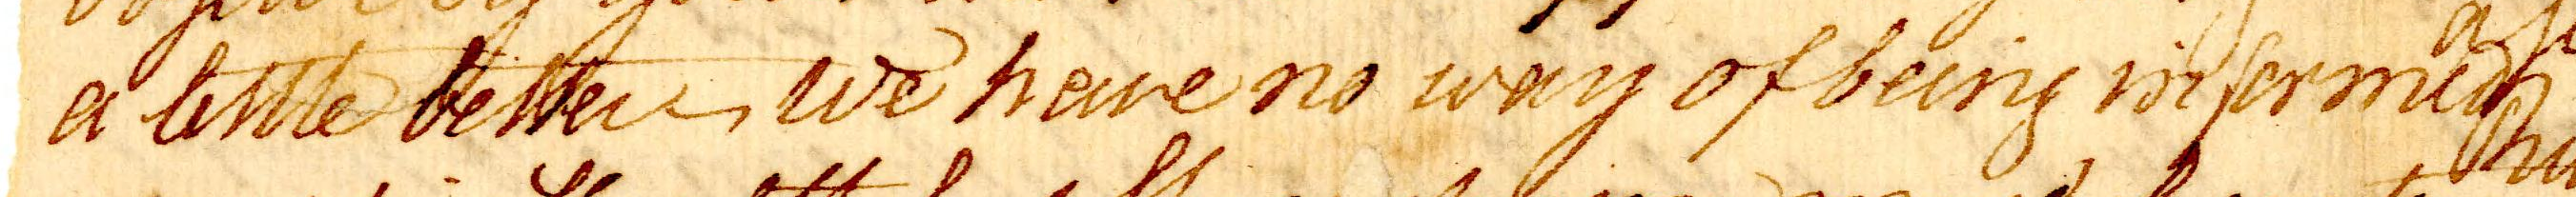a little better. We have no way of being informed
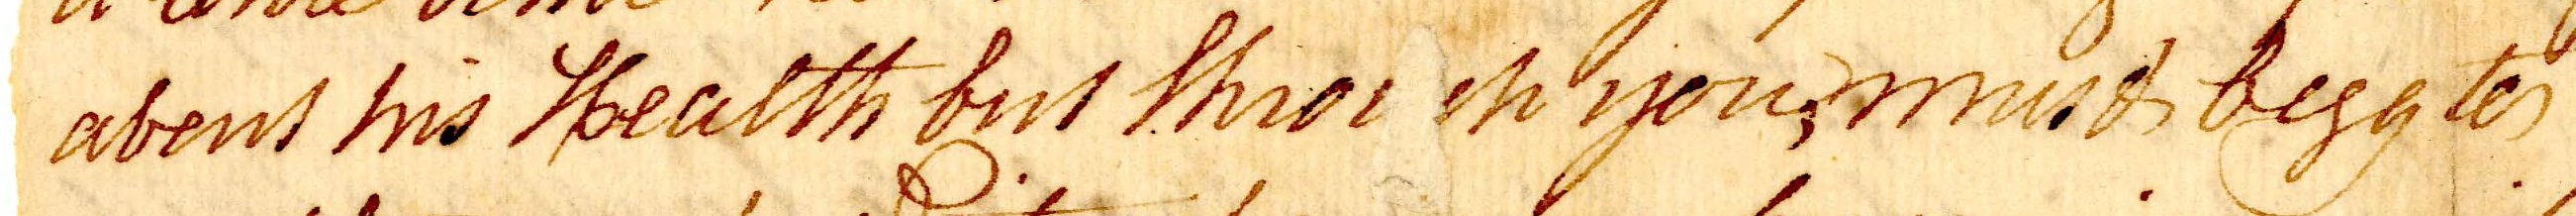about his health but thro on you; must begg to
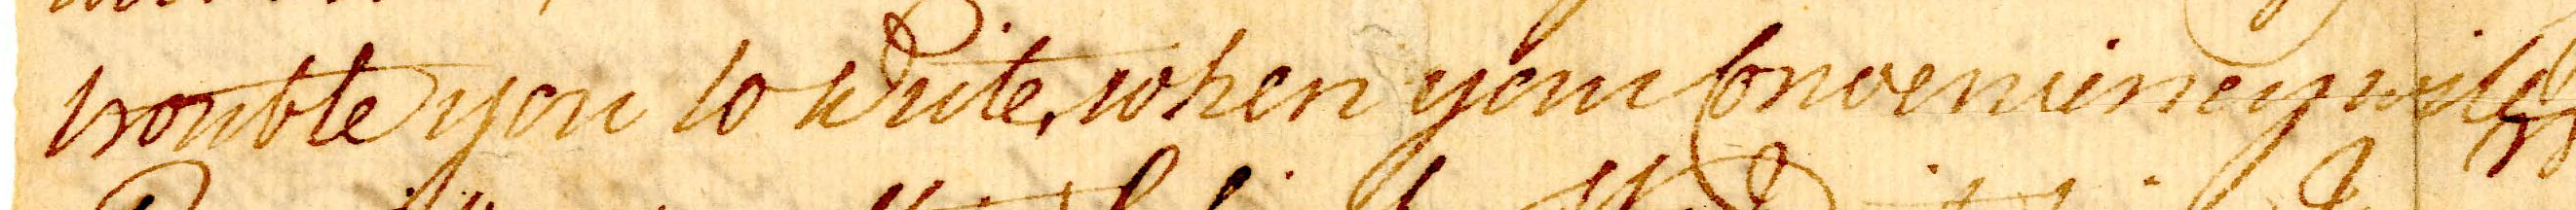trouble you to write, when your Conveniency will
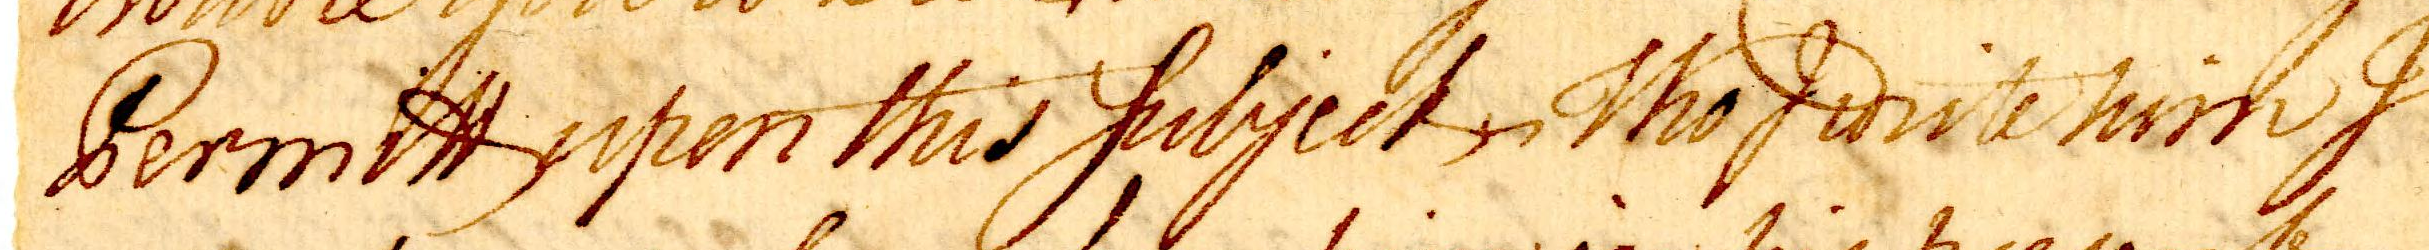Permitt upon this Subject. Tho I write him I
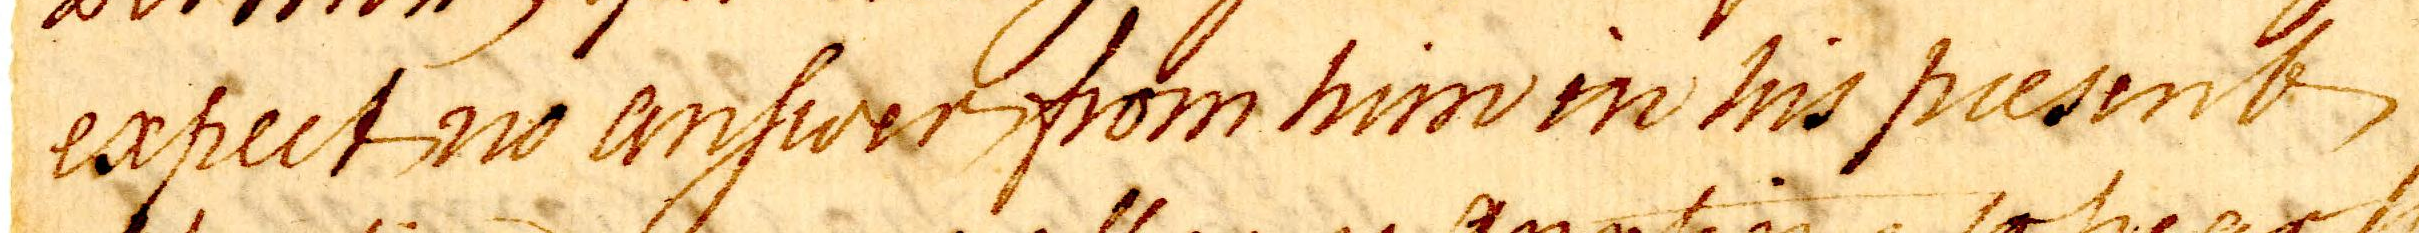expect no answer from him in his present
